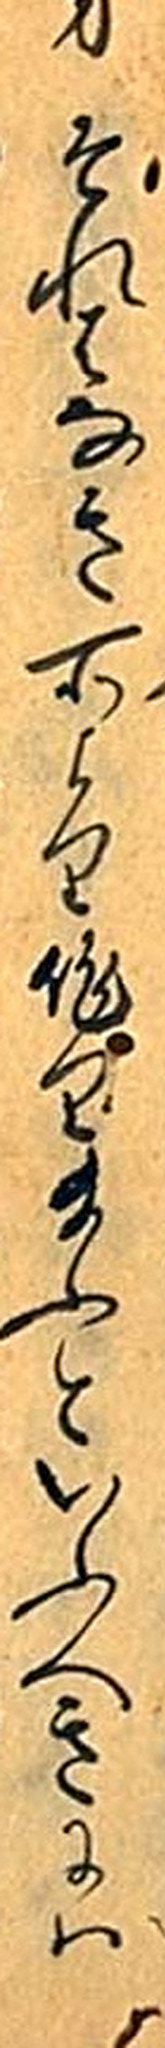弟それはなき所より作り給ふといふへきには
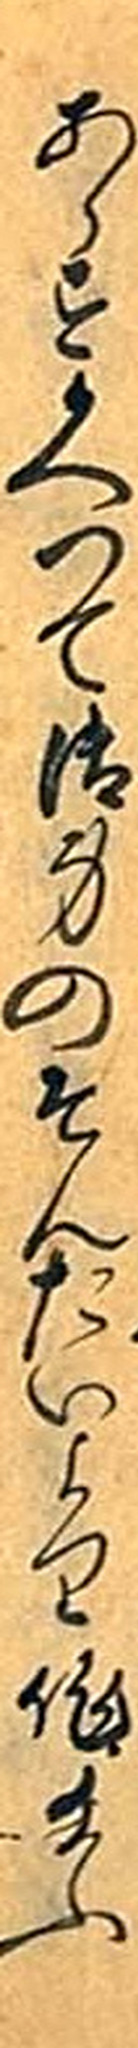あらすかへつて御身のそんたいより作給ふ
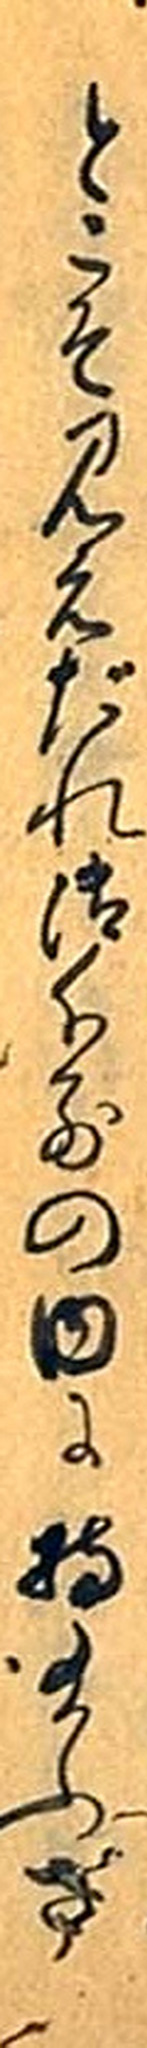とこそ見えたれ御分別の内に持給ふさ
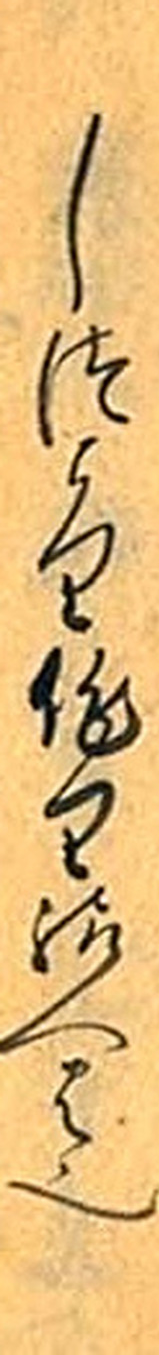しつより作り給へは也
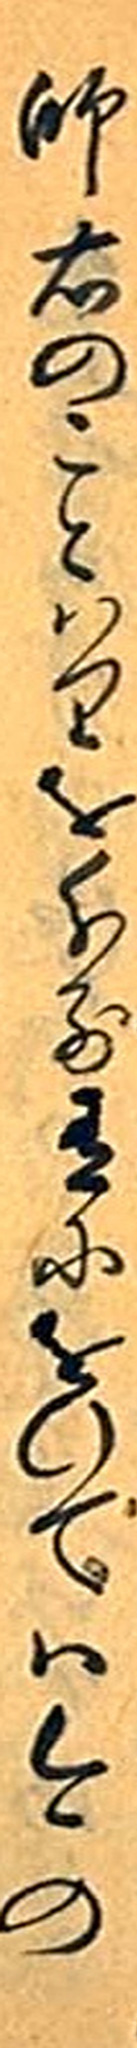師右のことはりを分別有にをひては今の
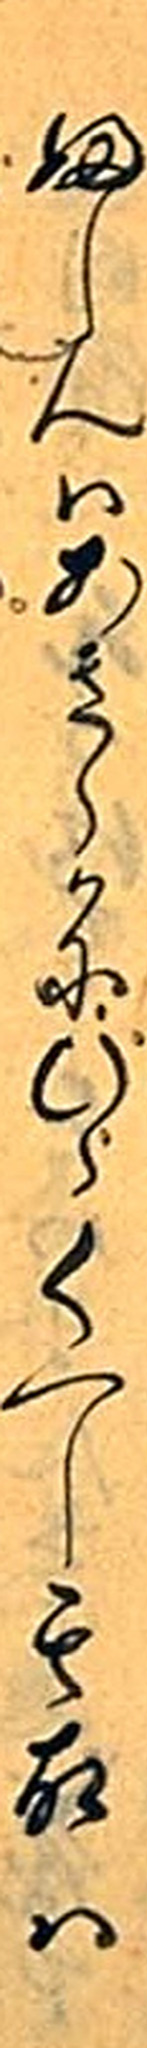ふしんはあきらかにひらくへし其故は
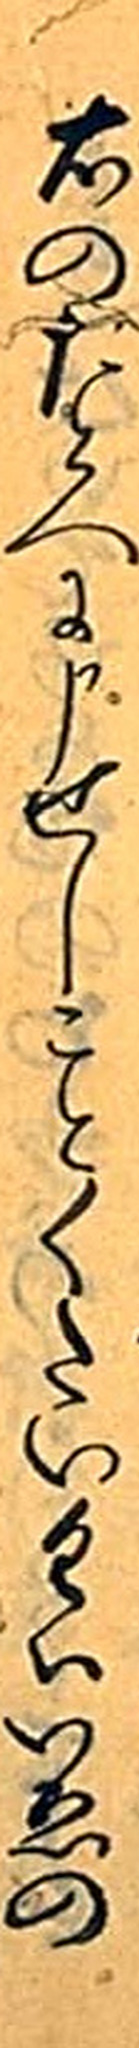右のたとへに申せしことくたいくはいゑの
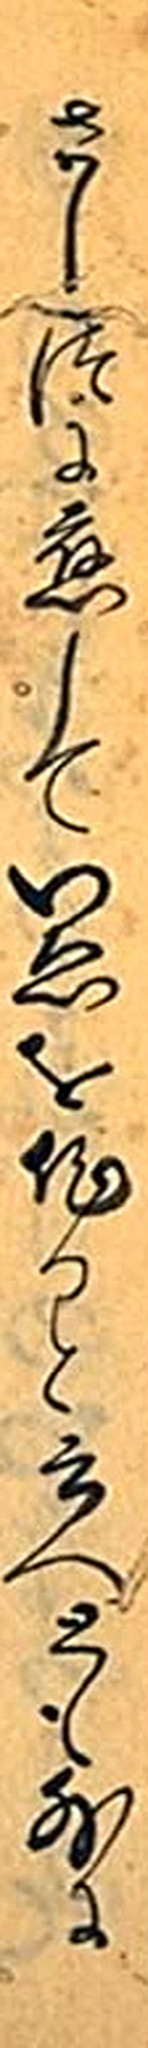さしつに応していゑを作ると云へとも外に
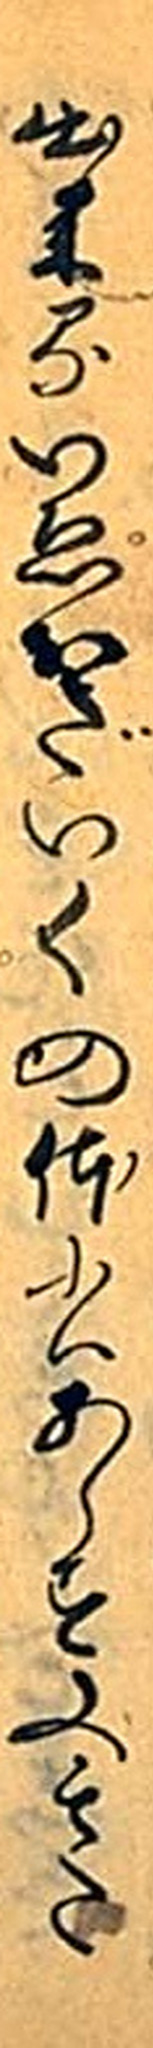出来るいゑはだいくの体にはあらす又其た
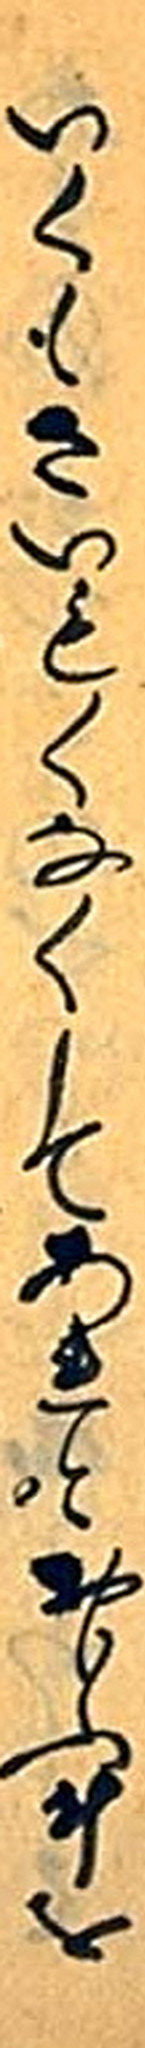いくもさいもくなくしてあれとおもふ計を
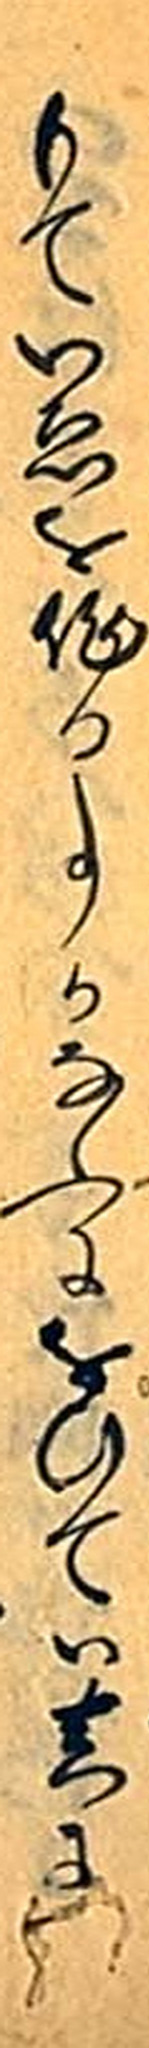もていゑを作る事かなふにをひては真に
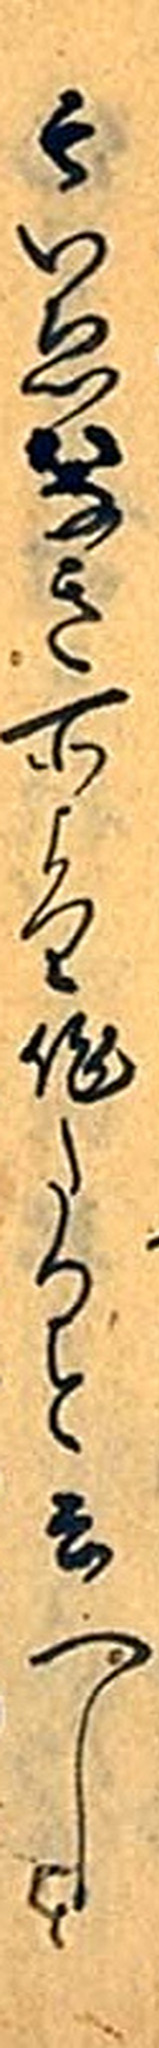其いゑはなき所より作たると云へし
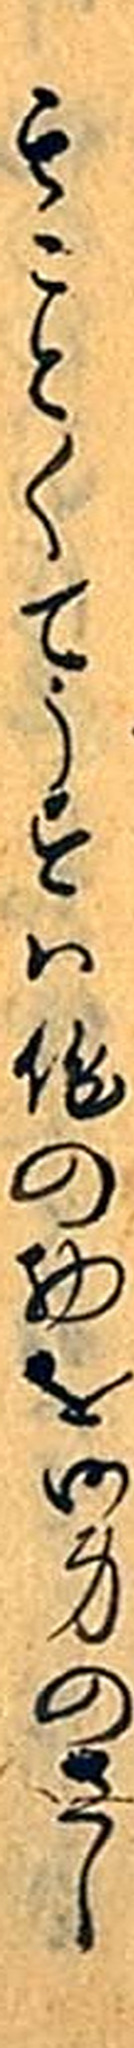其ことくてうすは作の物を御身のさし
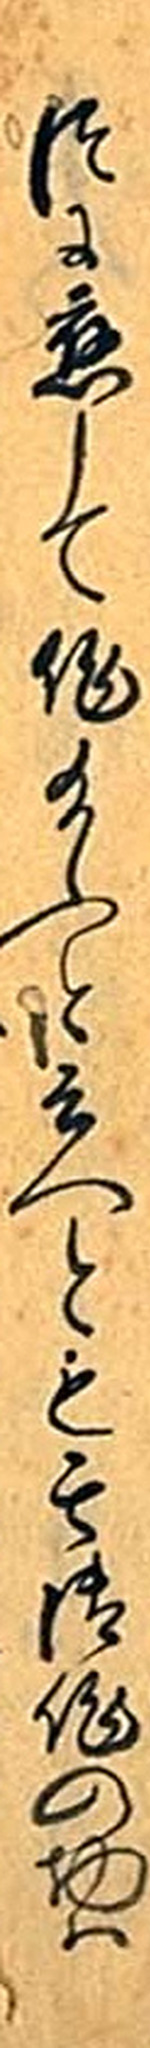つに応して作給ふと云へとも其御作の物は
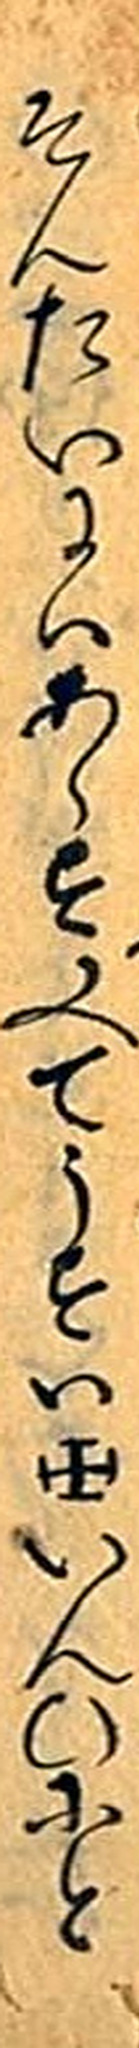そんたいにはあらす又てうすをは☩いんひにと
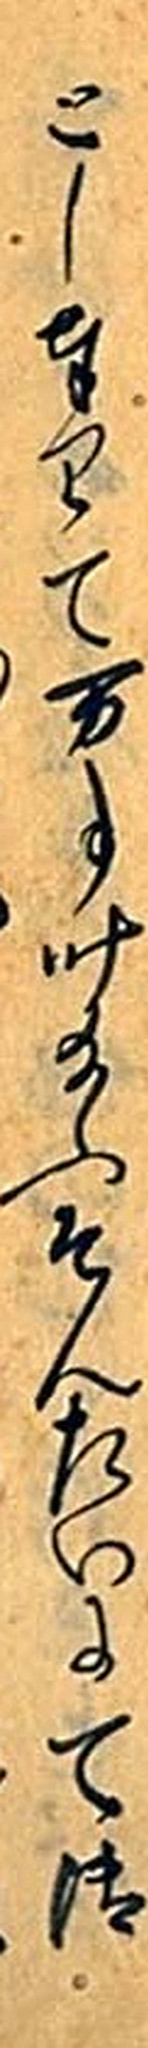とし奉りて万事叶給ふそんたいにて御
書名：ドチリナ・キリシタン
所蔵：東京大学総合図書館 / General Library in the University of Tokyo
